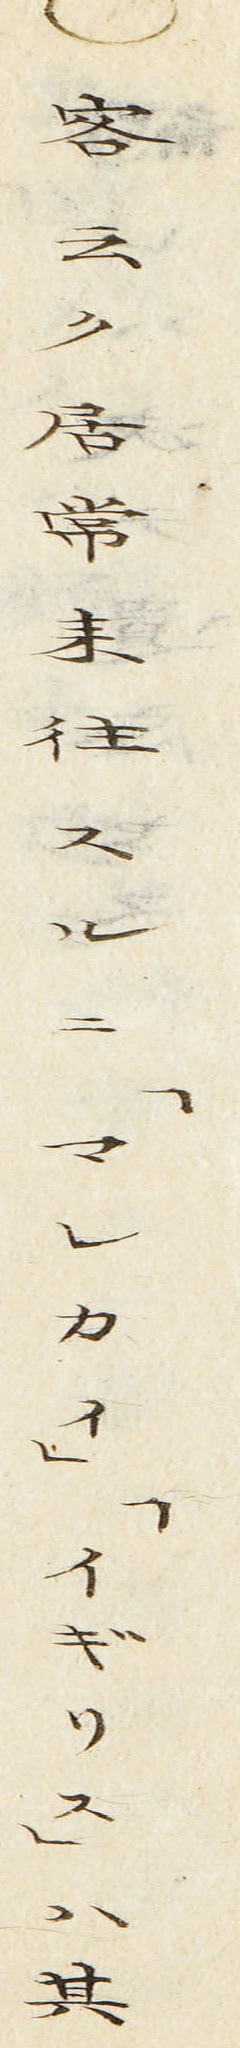〇客云ク居常来往スルニ「マレカイ」「イギリス」ハ其
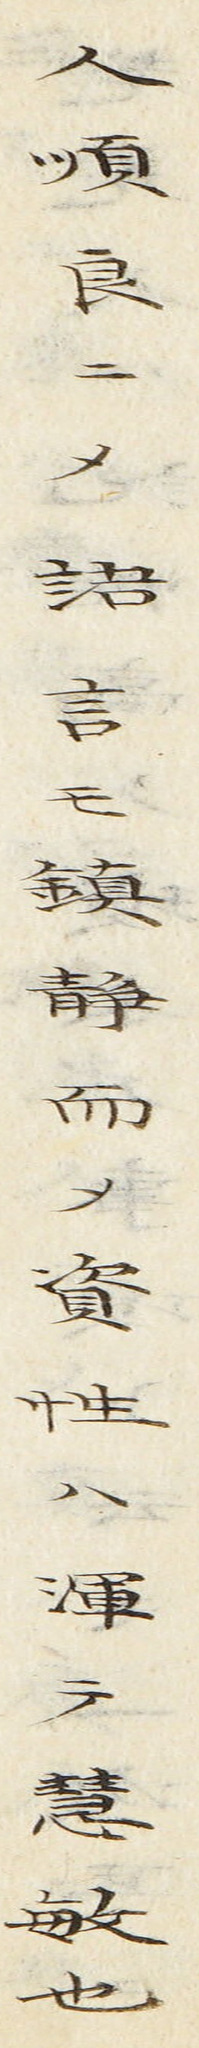人順良ニシテ語言モ鎮静而シテ資性ハ渾テ慧敏也
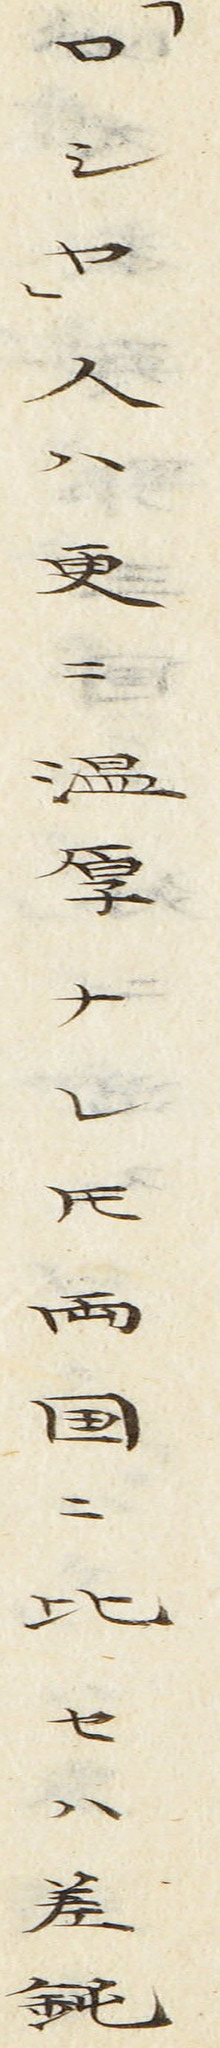「ロシヤ」人ハ更ニ温厚ナレドモ両国ニ比セハ差鈍
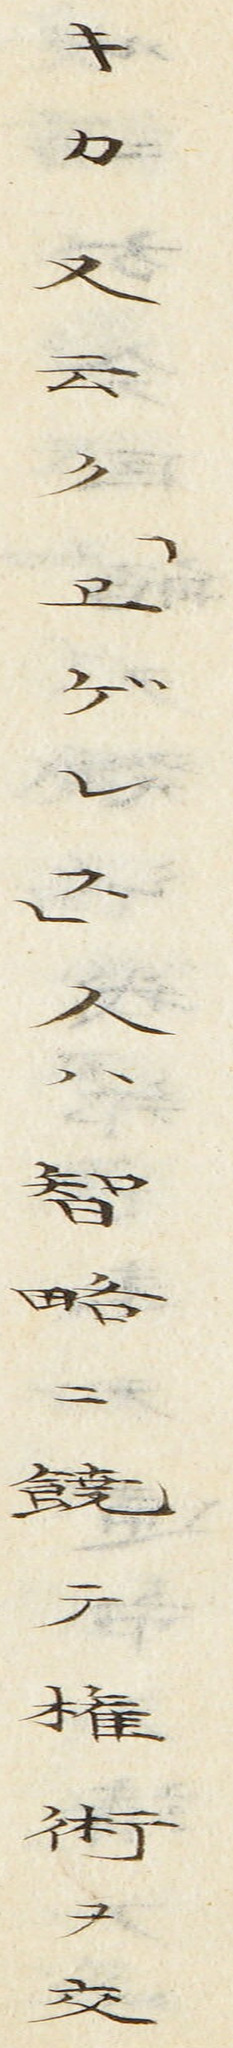キカ又云ク「ヱゲレス」人ハ智略ニ饒テ権術ヲ交
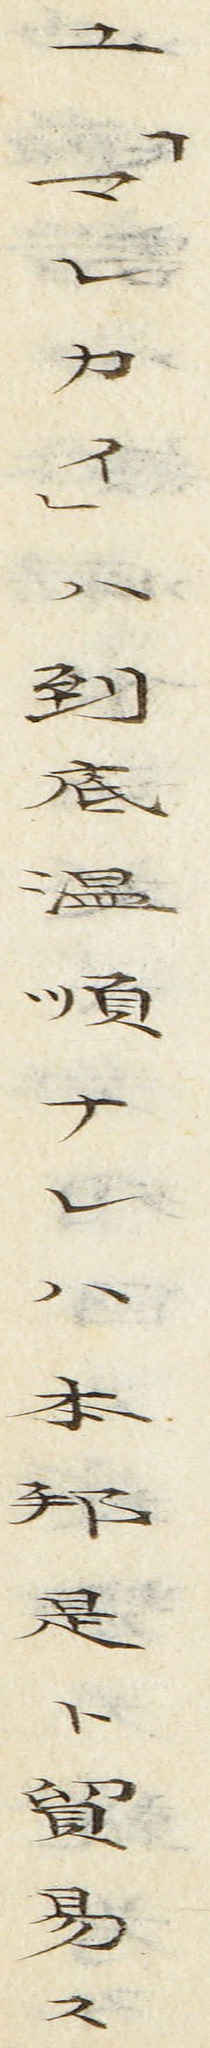ユ「マレカイ」ハ到底温順ナレハ本邦是ト貿易ス

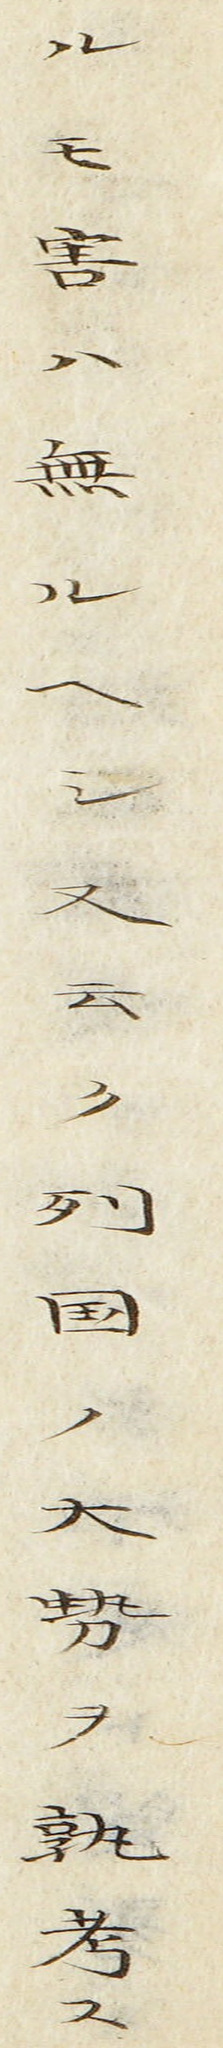ルモ害ハ無ルヘシ又云ク列国ノ大勢ヲ孰考ス
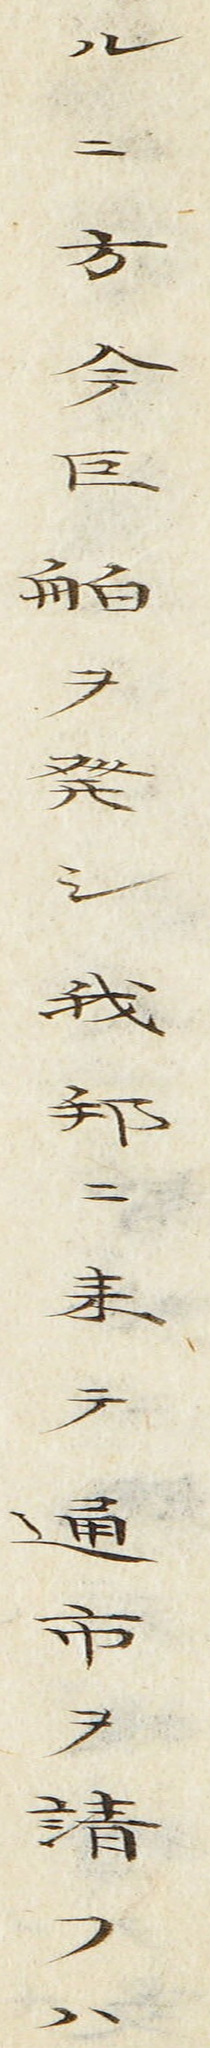ルニ方今巨舶ヲ発シ我邦ニ来テ通市ヲ請フハ
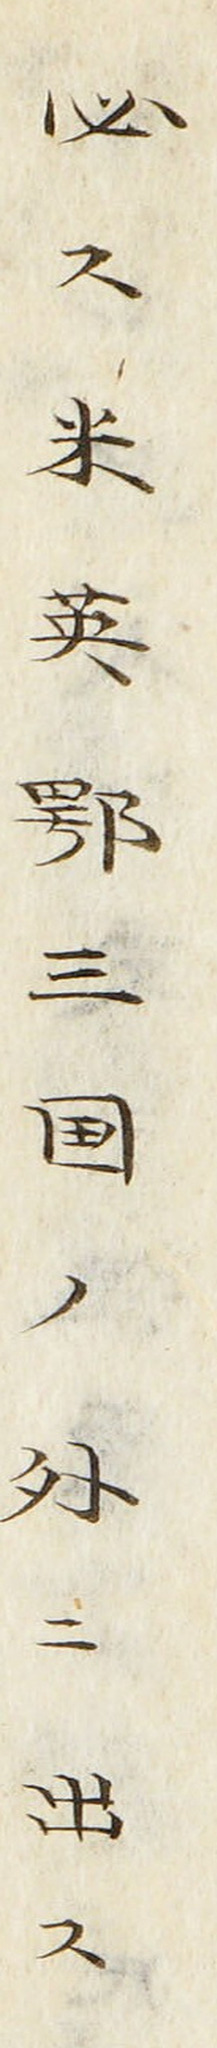必ス米英鄂三国ノ外ニ出ス
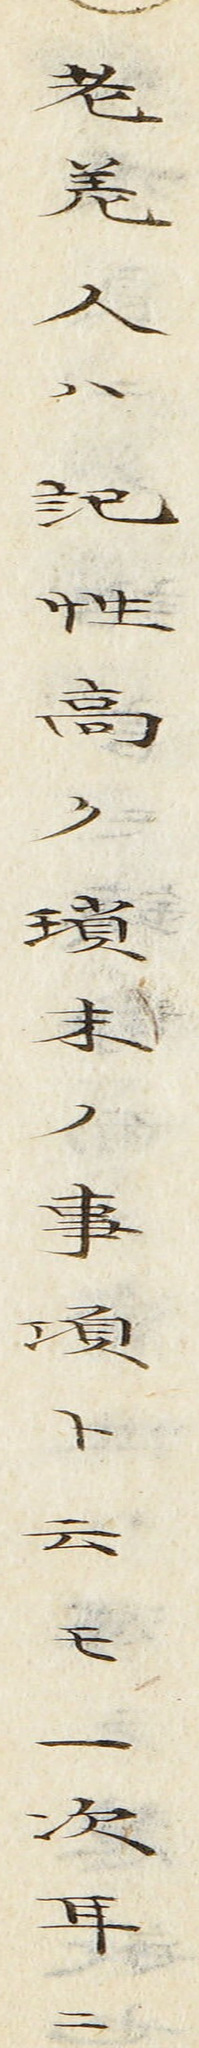〇老羗？人は記性高ク瑣末ノ事項ト云モ一次耳ニ
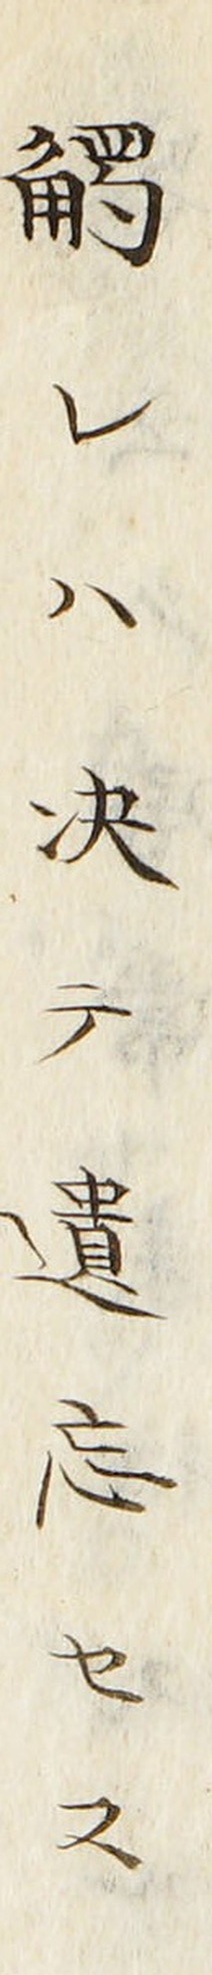触レハ決テ遺忘セス
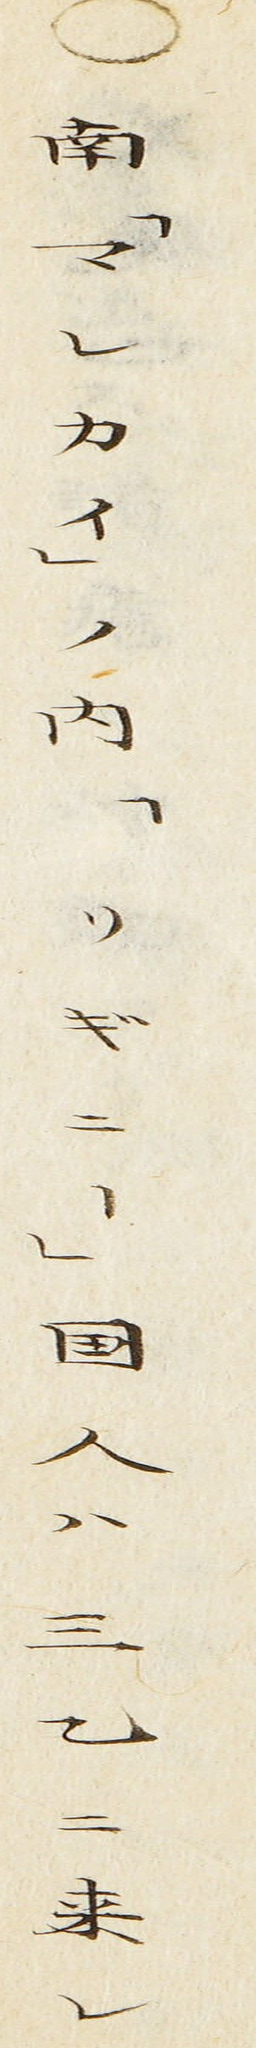〇南「マレカイ」ノ内「リギニー」国人ハ三乙？ニ来レ
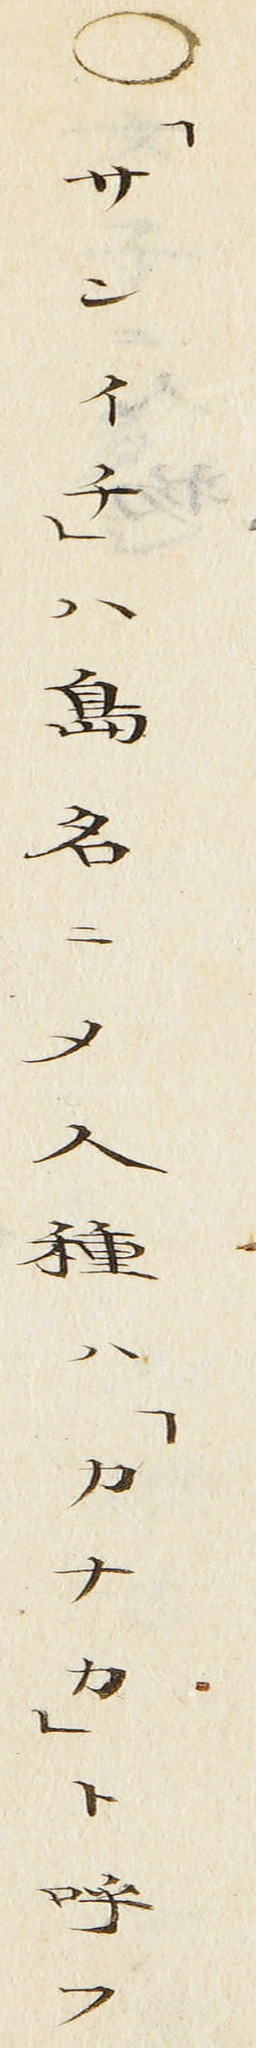〇「サンイチ」ハ島名ニシテ人種ハ「カナカ」ト呼フ
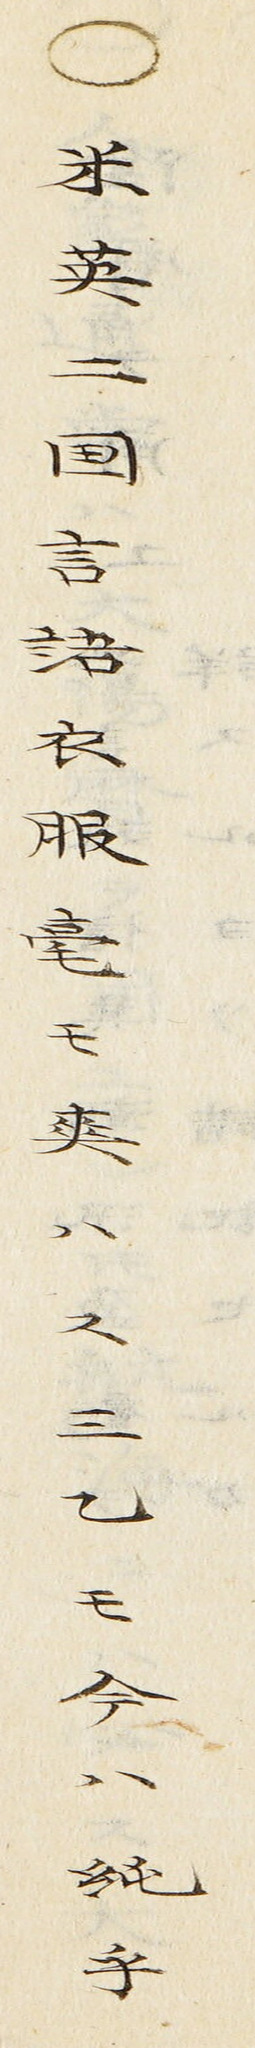〇米英二国言語衣服毫モ爽ハス三乙モ今ハ純乎
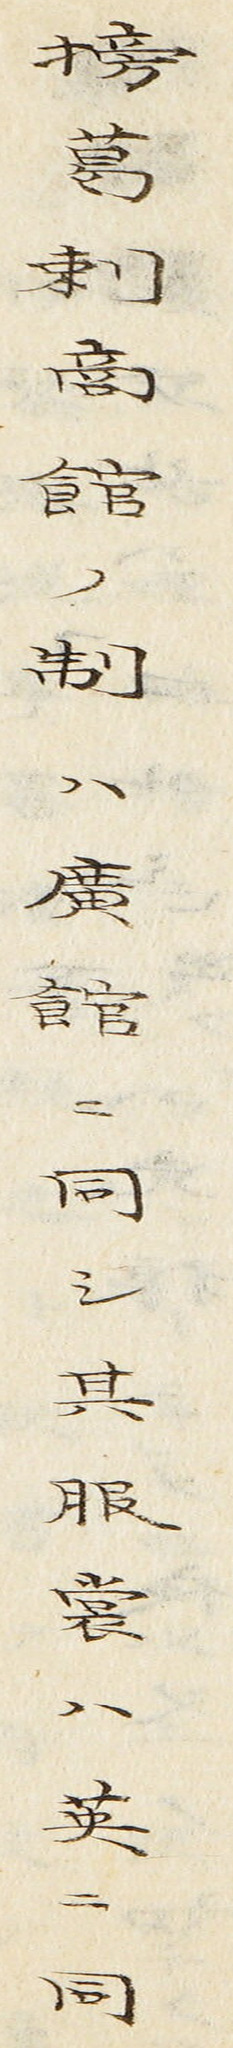〇榜葛刺商館ノ制ハ広館ニ同シ其服裳ハ英ニ同
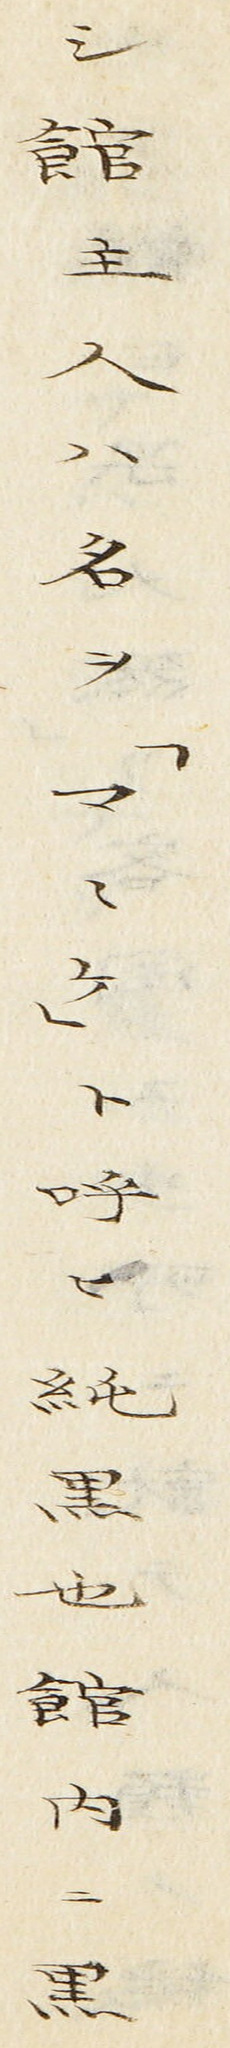シ館主人ハ名ヲ「マ々ケ」ト呼ひ純黒也館内ニ黒
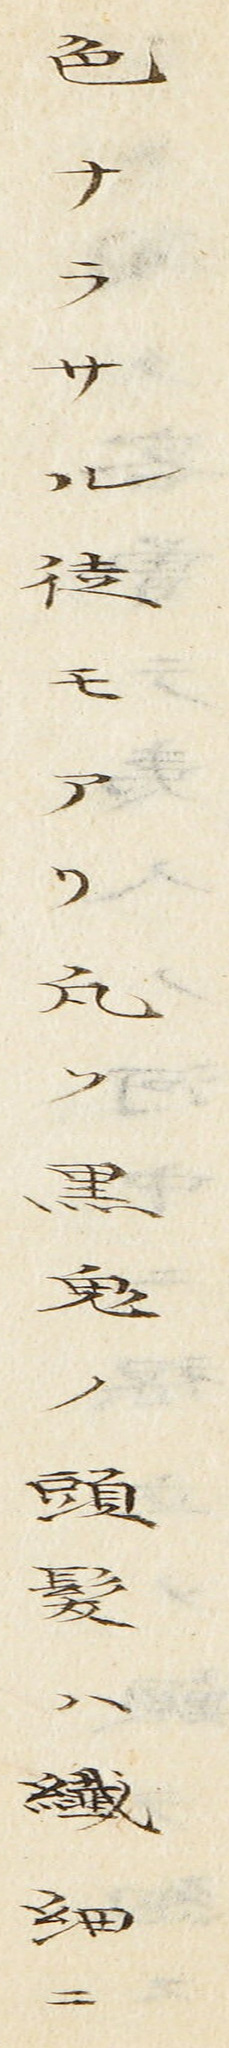色ナラサル徒モアリ凡ソ黒鬼ノ頭髪ハ繊細ニ
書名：蕃談
